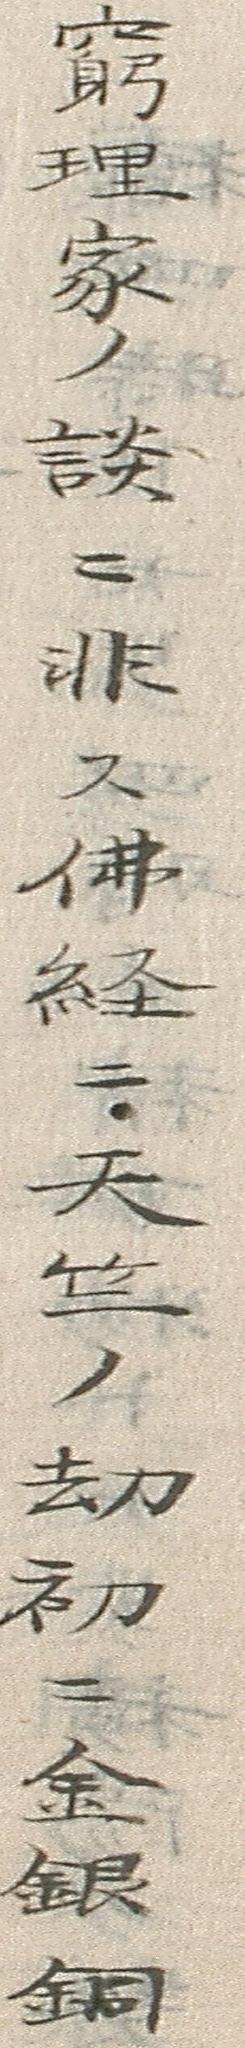窮理家ノ談ニ非ス仏経ニ天竺ノ劫初ニ金銀銅
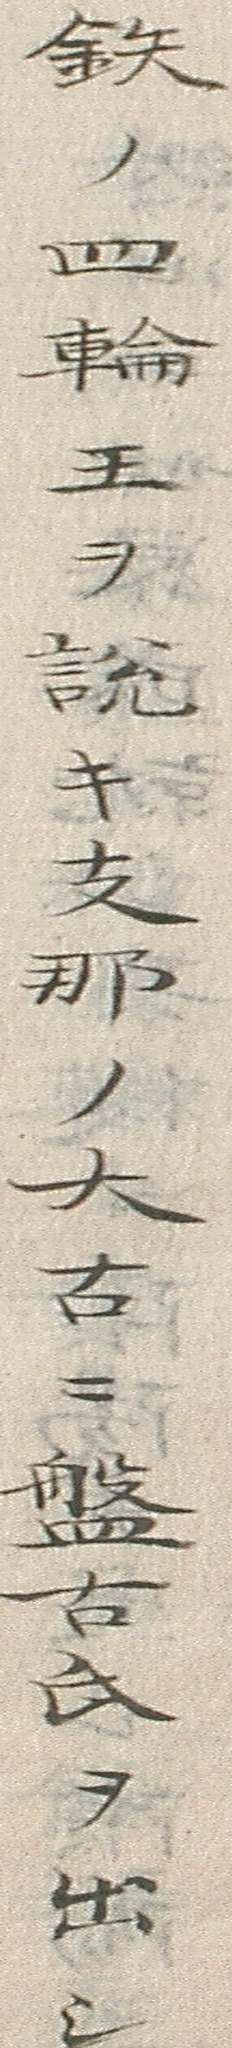鉄ノ四輪王ヲ説キ支那ノ大古ニ盤古氏ヲ出シ
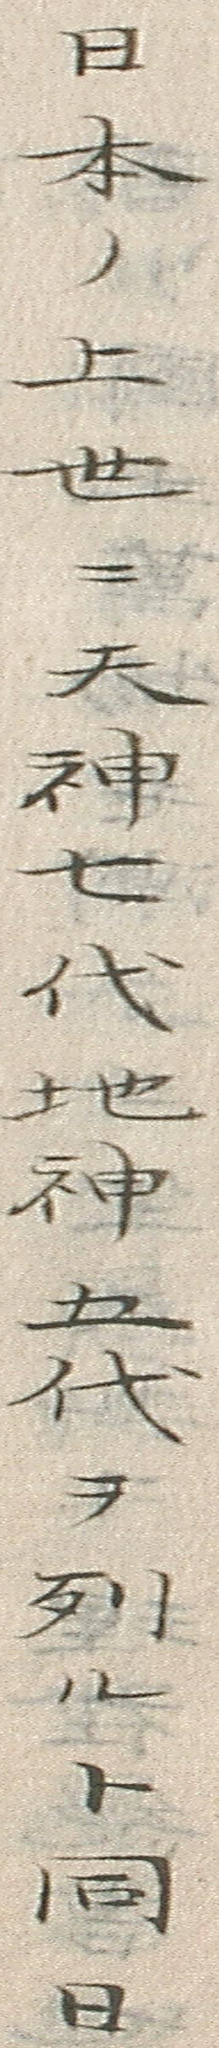日本ノ上世ニ天神七代地神五代ヲ列ルコト同日
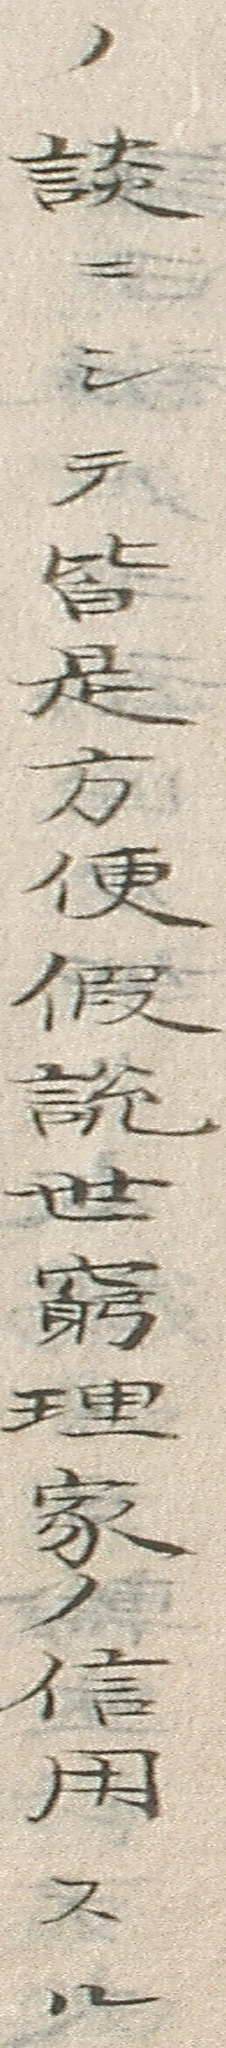ノ談ニシテ皆是方便仮説世窮理家ノ信用スル
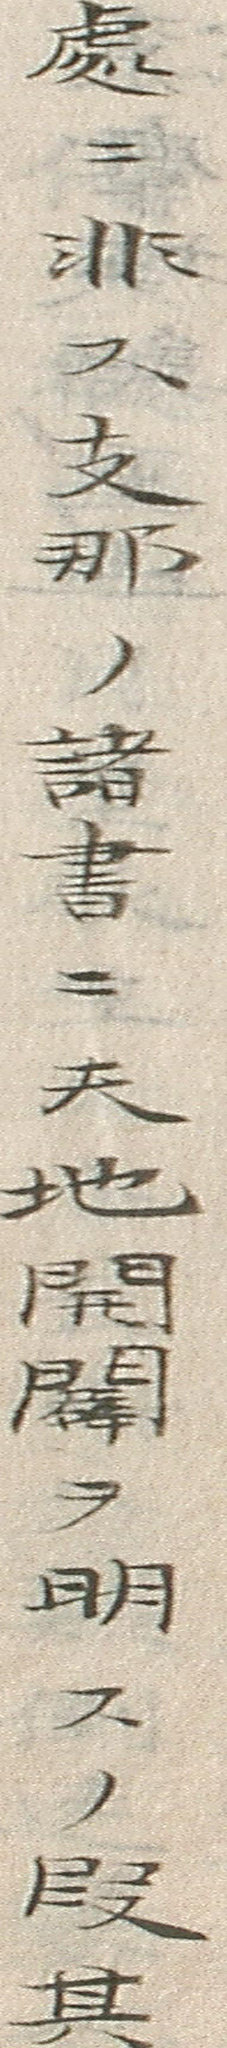処ニ非ス支那ノ諸書ニ天地開闢ヲ明スノ叚其
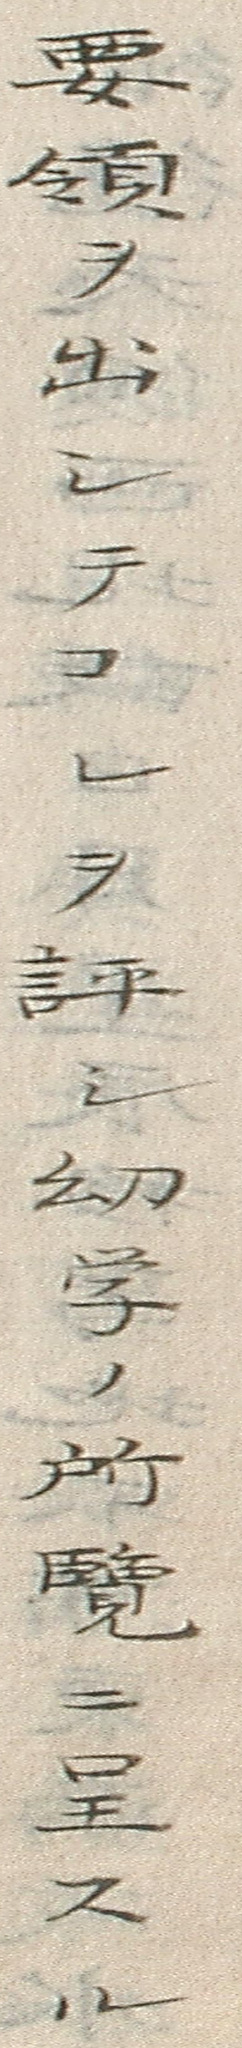要領ノ出シテコレヲ評シ幼学ノ所覧ニ呈スル
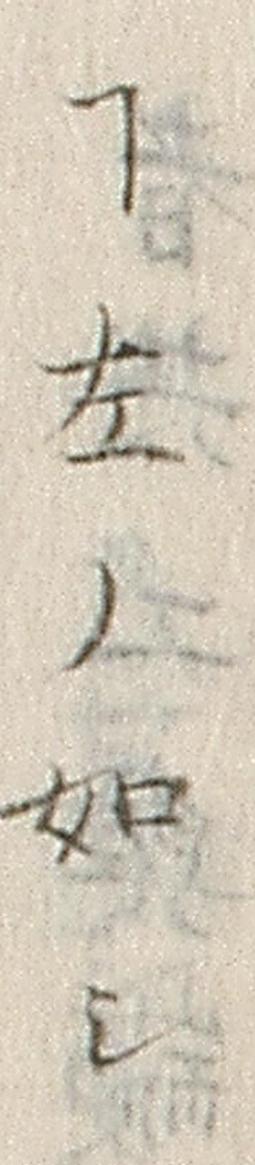コト左ノ如シ
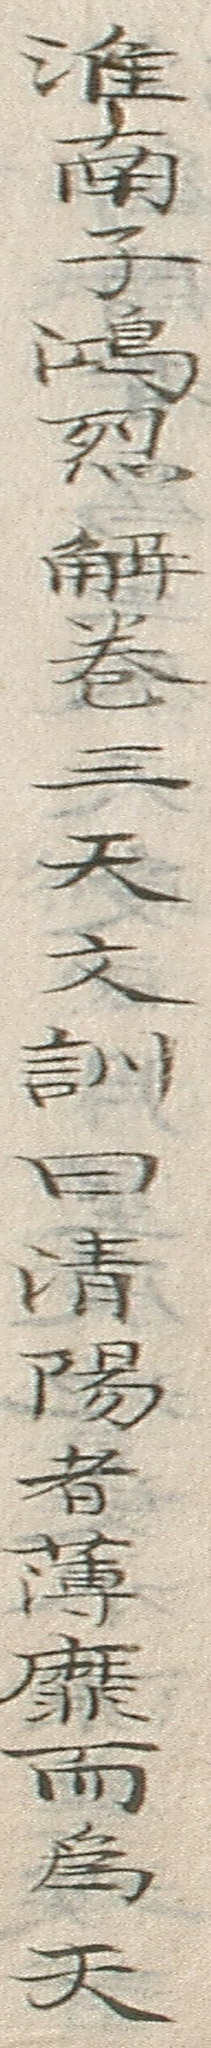淮南子鴻烈解巻三天文訓曰清陽者薄靡而為天
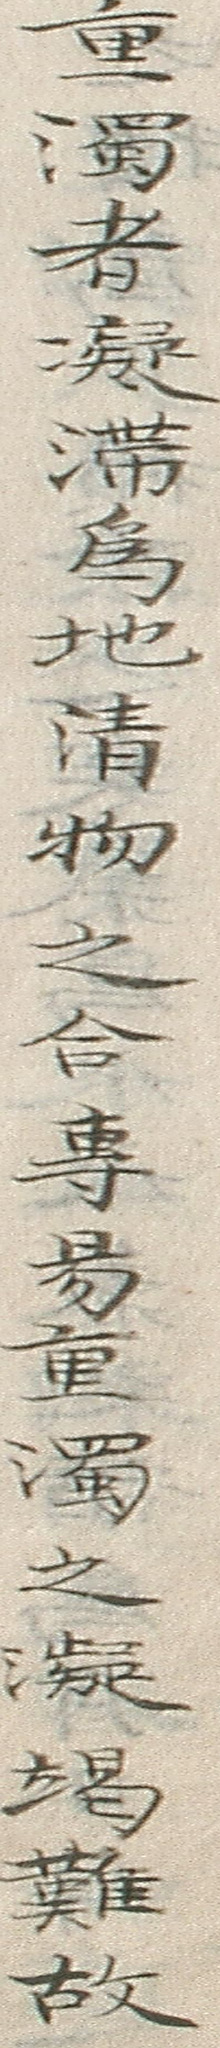重濁者凝滞為地清物之合専易重濁之凝竭難故
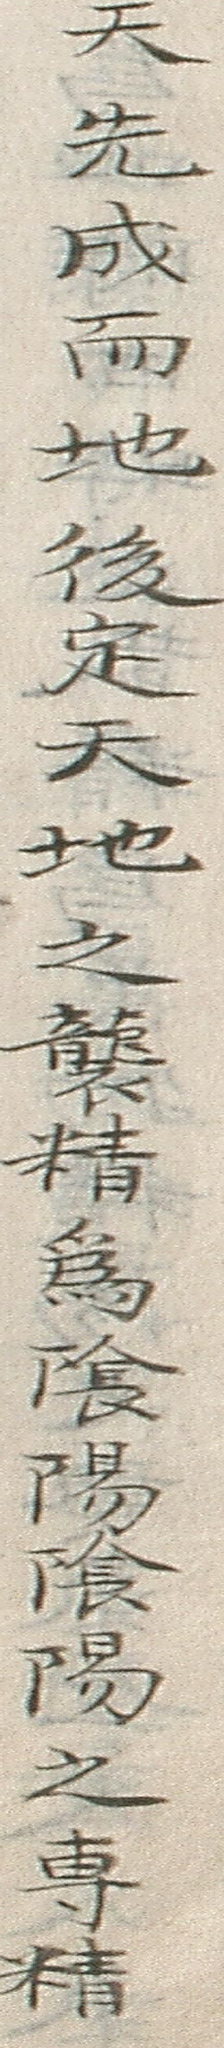天先成而地後定天地之襲精為陰陽陰陽之専精

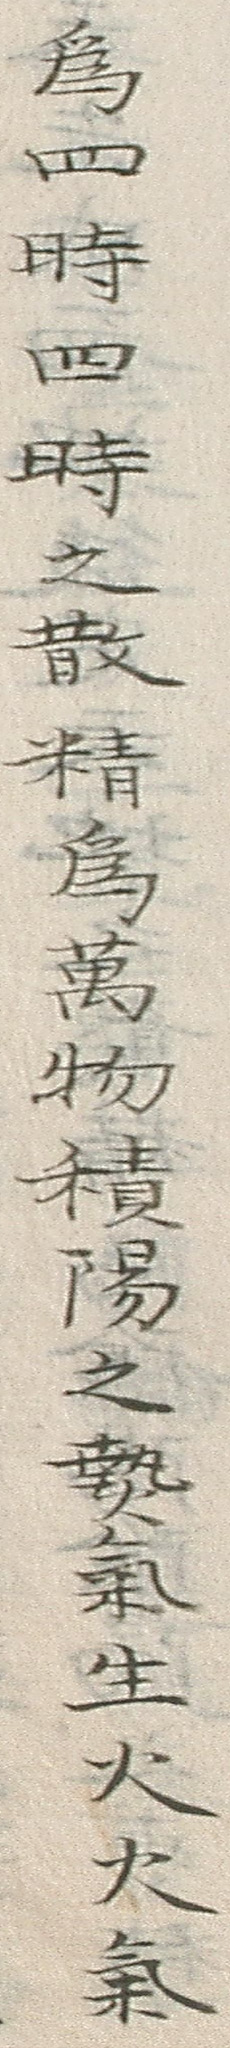為四時四時之散精為万物積陽之熱気生火火気
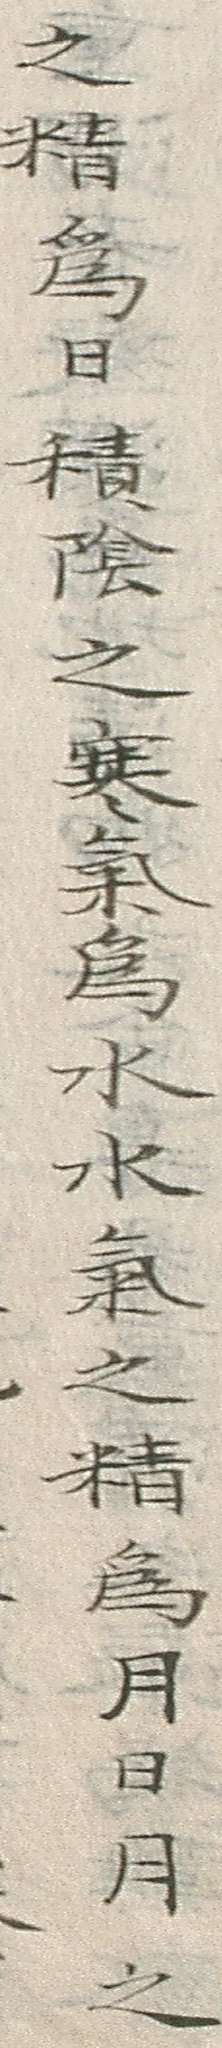之精為日積陰之寒気為水水気之精為月日月之
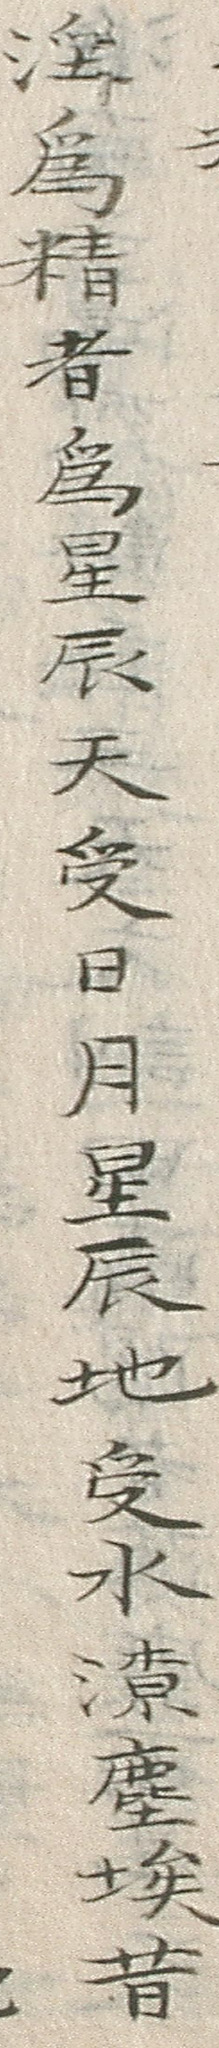淫為精者為星辰天受日月星辰地受水潦塵埃昔
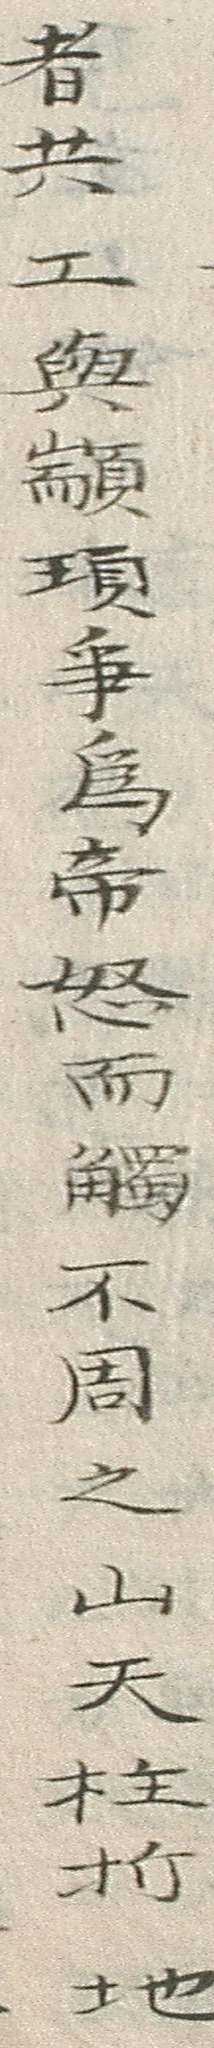者共工与顓頊争為帝怒而触不周之山天柱折地
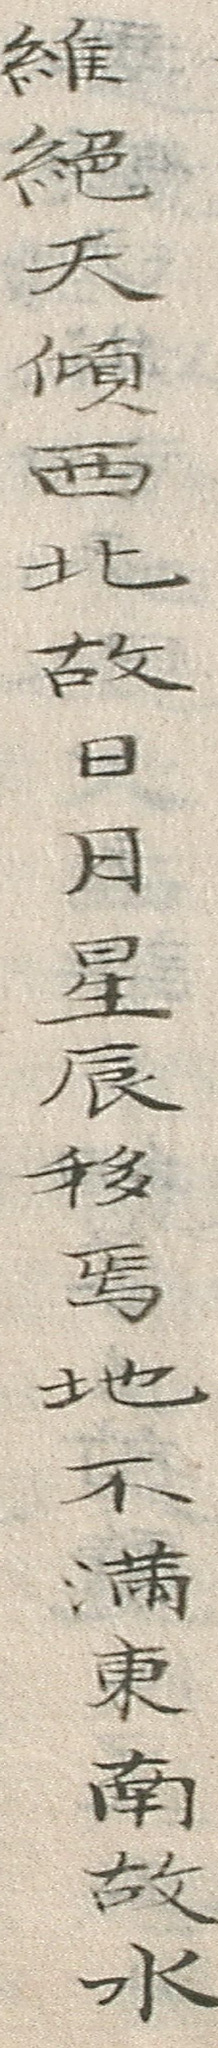維絶天傾西北故日月星辰移焉地不満東南故水
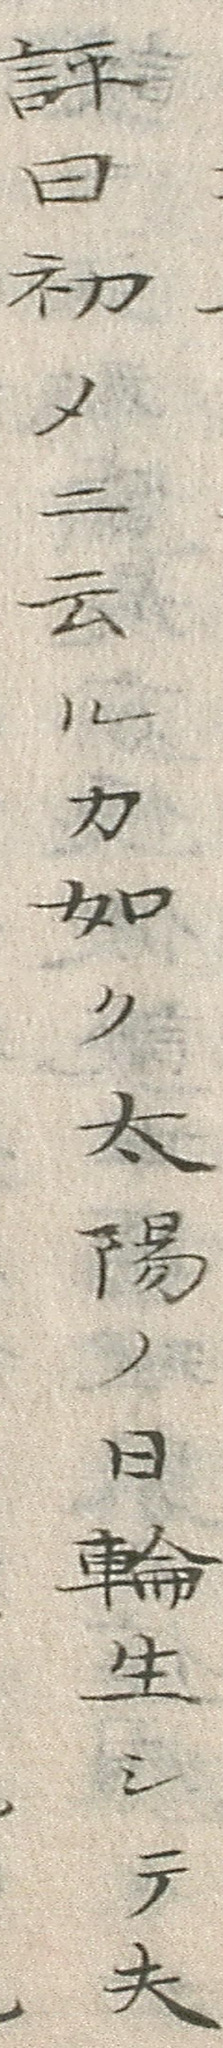評曰初メニ云ルカ如ク太陽ノ日輪生シテ夫
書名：天學略名目羽翼　全
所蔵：東京大学地震研究所図書室 Earthquake Research Institute Library, The University of Tokyo, JAPAN
